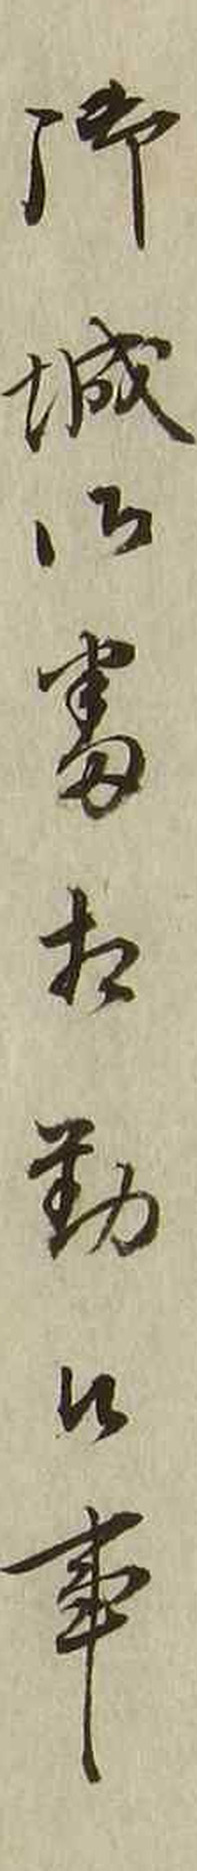御城御番相勤め候事
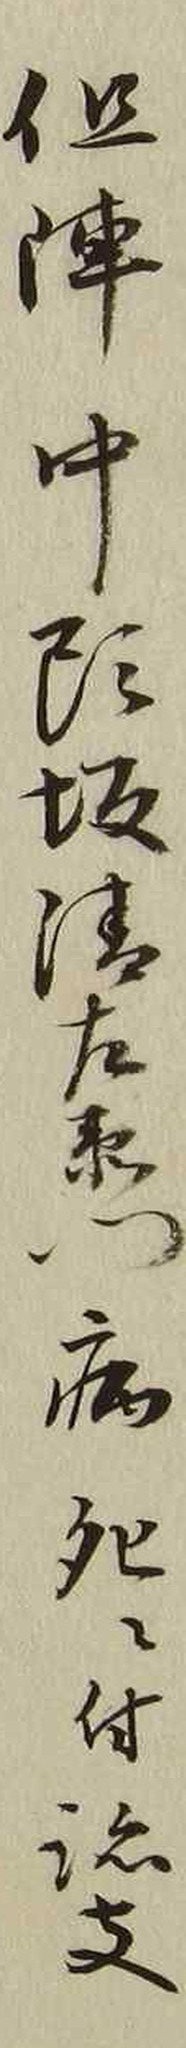但し陣中頭坂清左衛門病死ニ付き諸支
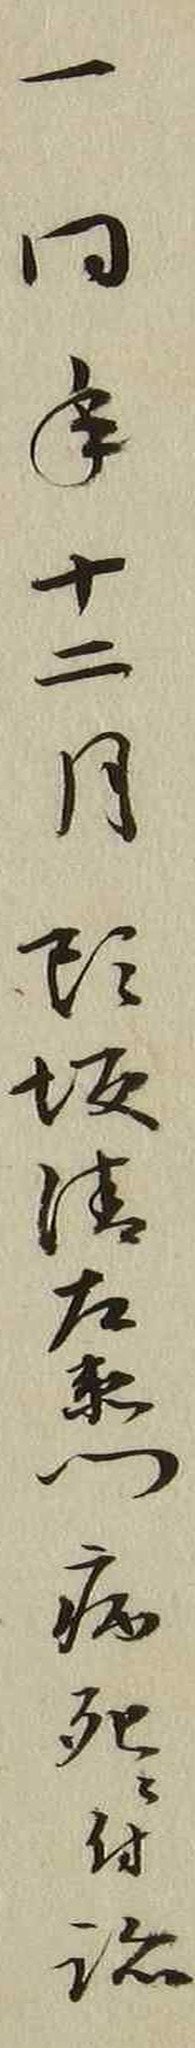一同年十二月頭坂清左衛門病死ニ付き諸
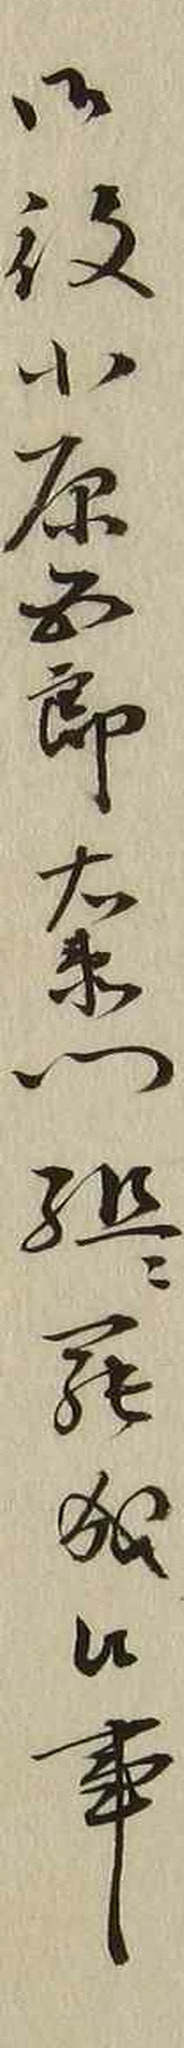御役小原五郎右衛門組ニ罷り成り候事
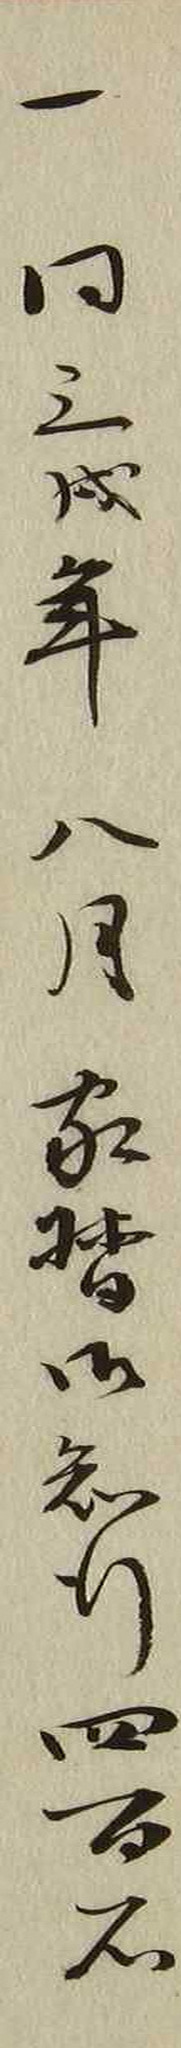一同三戌年八家督御知行四百石
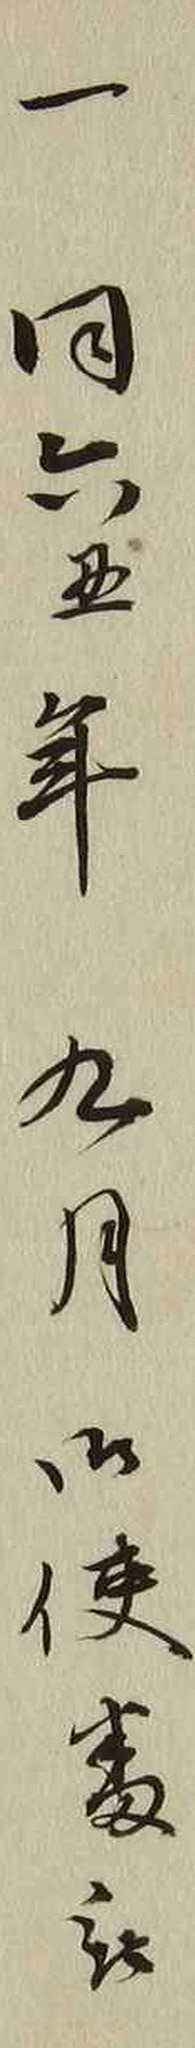一同六丑年九月御使い番
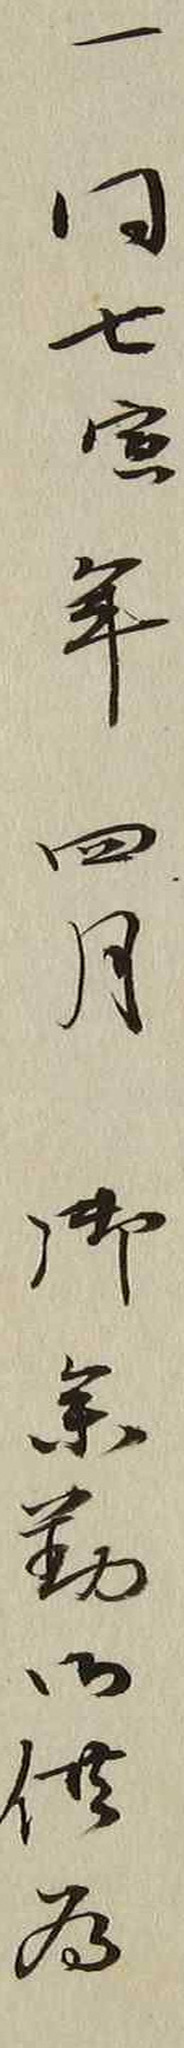一同七寅年四月御参勤御供
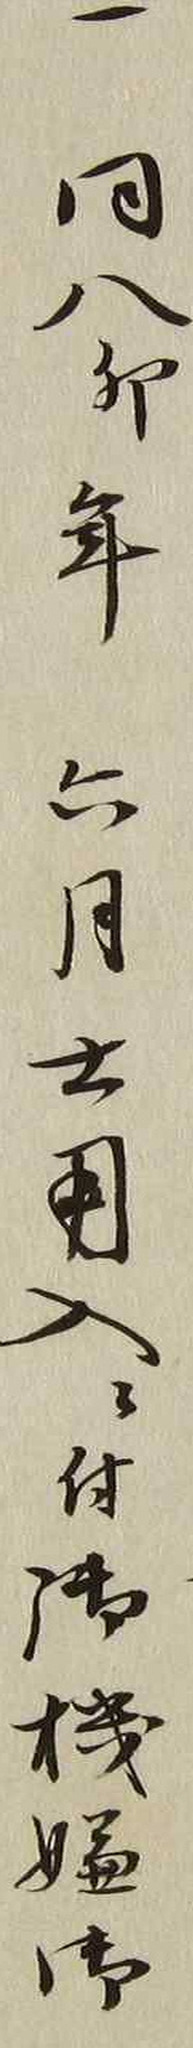一同八卯年六月土用入りニ付き御機嫌御
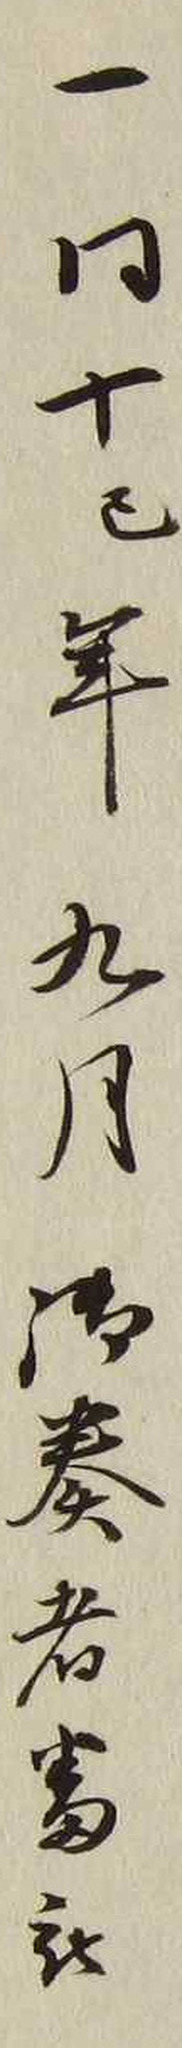一同十巳年九月御奏者番

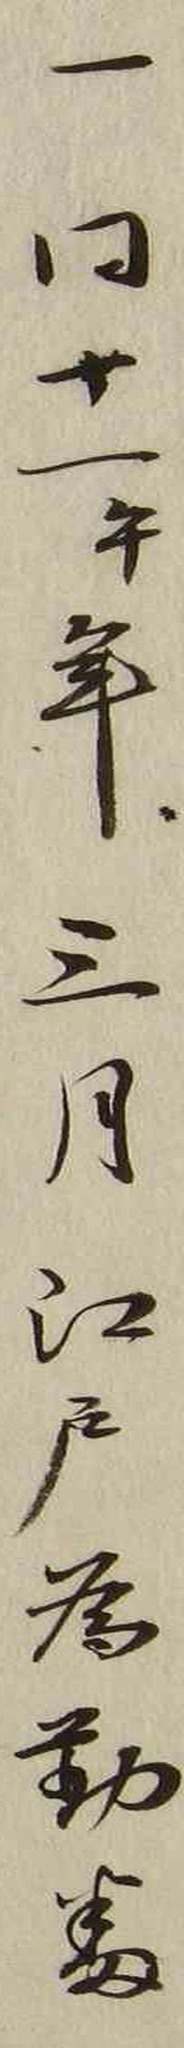一同十一午年三月江戸勤番之為
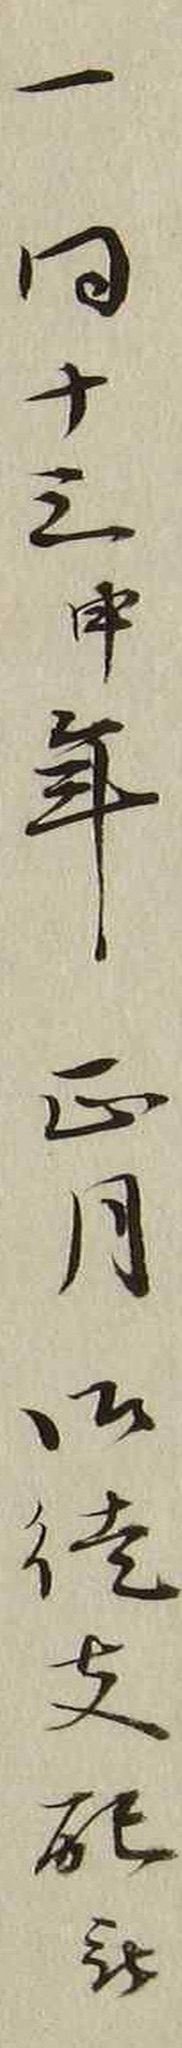一同十三申年正月御徒支配
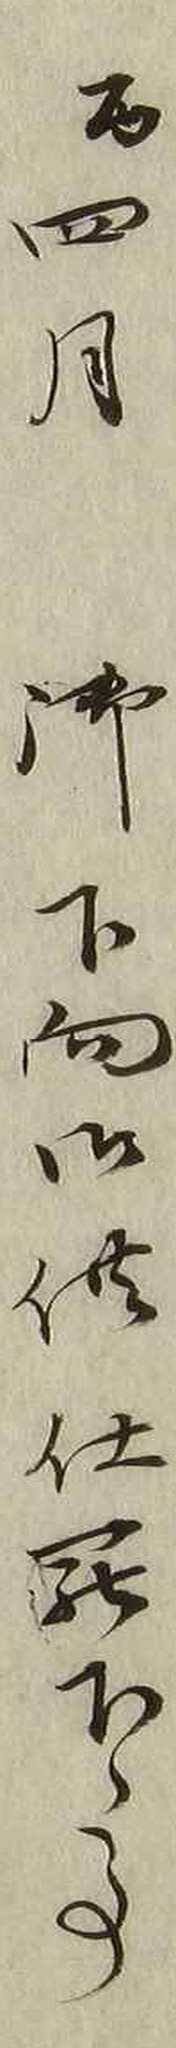酉四月御下向御供仕罷り下り候事
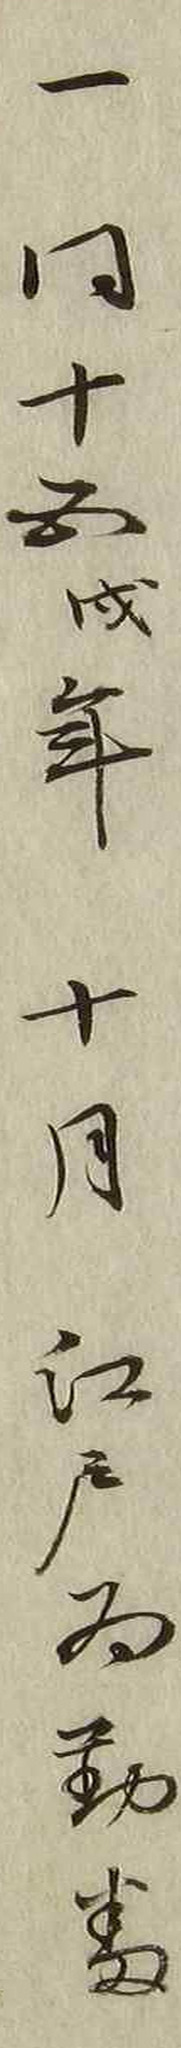一同十五戌年十月江戸勤番之為
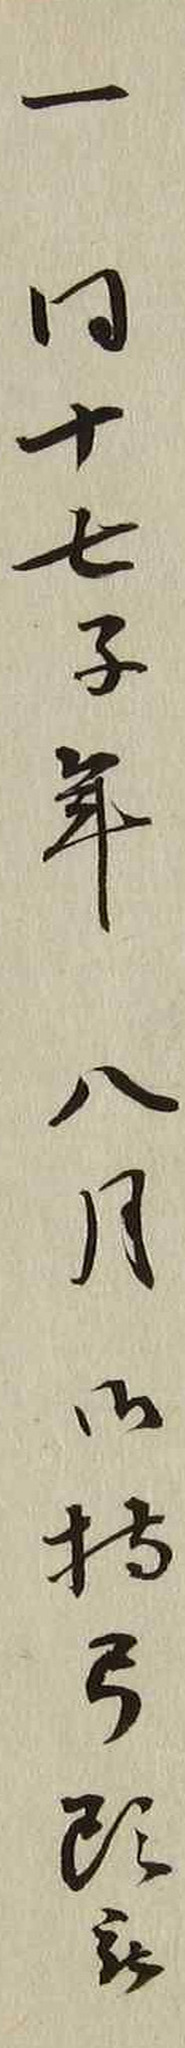一同十七子年八月御持ち弓頭
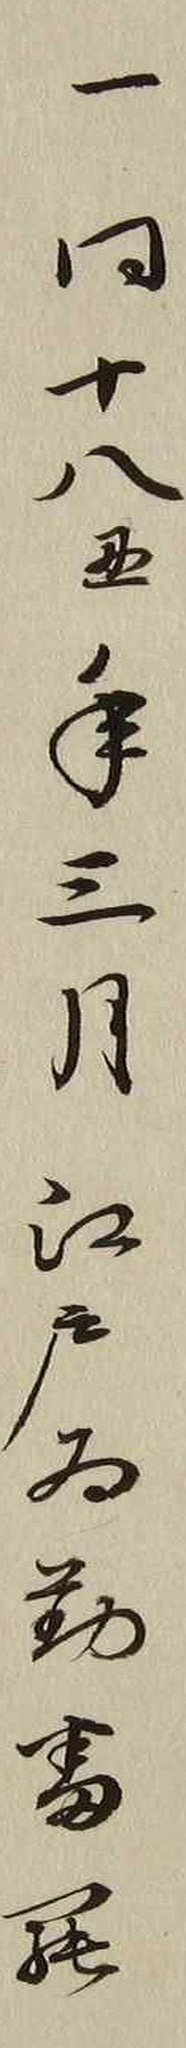一同十一午年三月江戸勤番之為
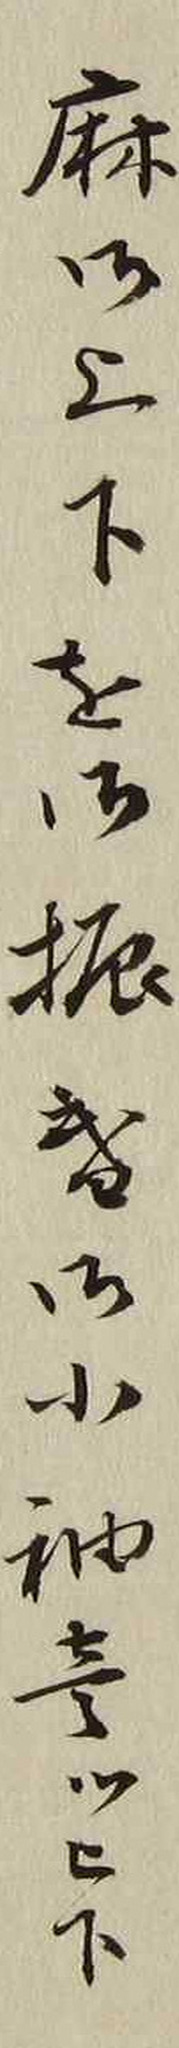麻御上下を御振替御小袖壱ッ下し
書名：諸士系譜　巻之16　い之部16
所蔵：会津若松市立会津図書館
